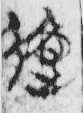○（路）
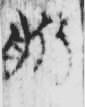斨
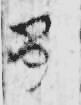邑
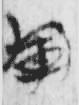軍
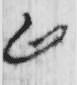㠯（以）
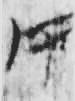反
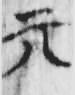亓（其）
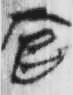官
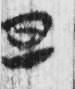旦
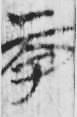○（娩）
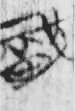戠
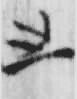之
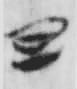旦
